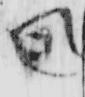耴
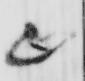㠯（以）
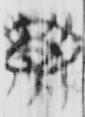𨍱（乘）
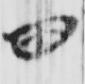田
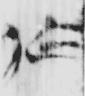於
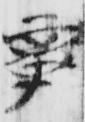章
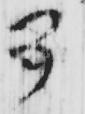邑
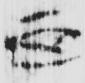正
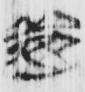義
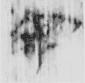牢
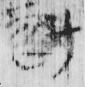戠
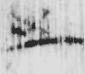之
